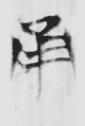甬
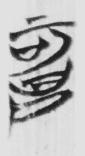{可克}
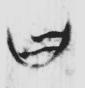曰
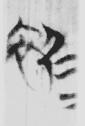{衣𡰥}=
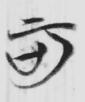可
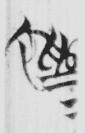{它爲}=
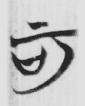可
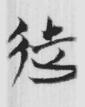徒
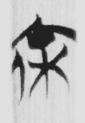儈
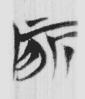所
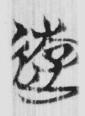遊
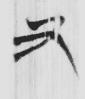又
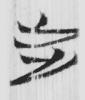歨
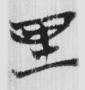里
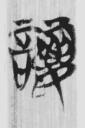謱
